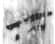二
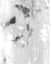方
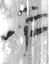下
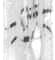不
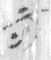可
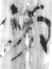凥（居）
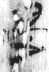是
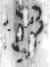{胃刀}（謂）
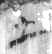土
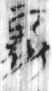聚
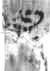見
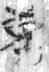東
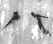北
